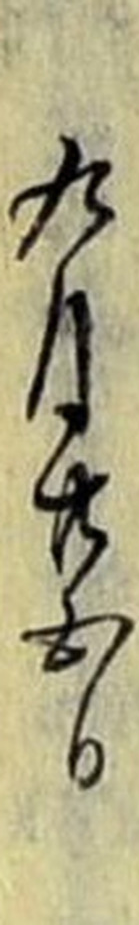九月廿五日
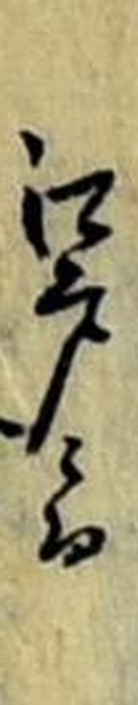江戸ニ而
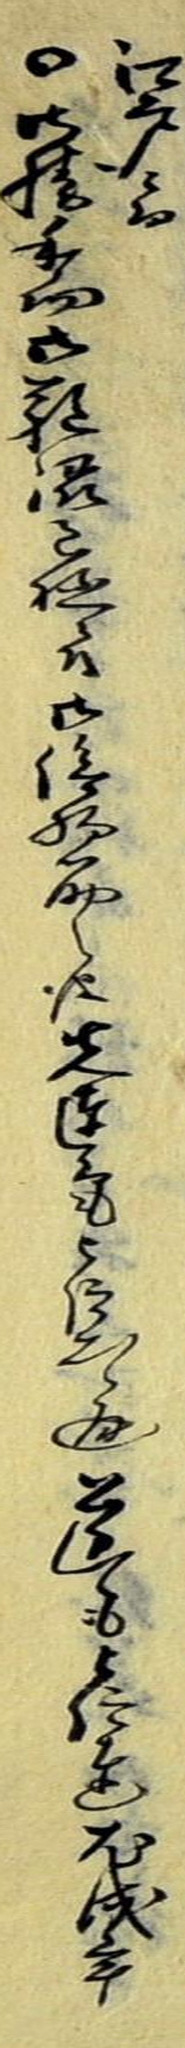〇御勝手向御難渋至極ニ付御倹約筋之儀先達而も被仰出候通公辺へも被仰達尤戌年

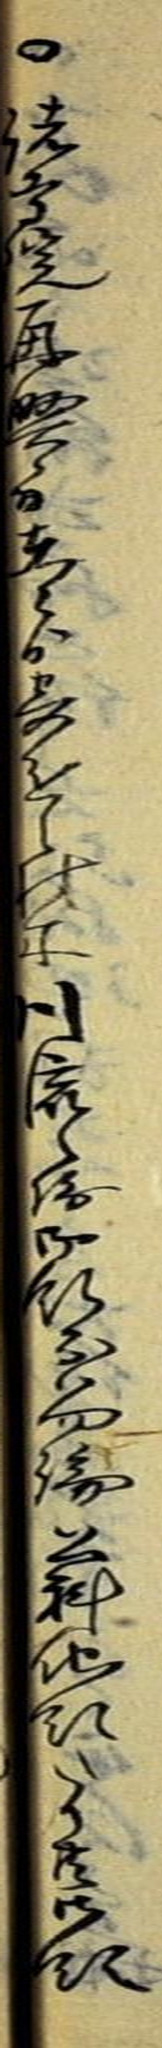〇諸寺院再興ニ付在々ゟ寄進之材木川流候儀御領分ハ勿論公料他領たり共御領

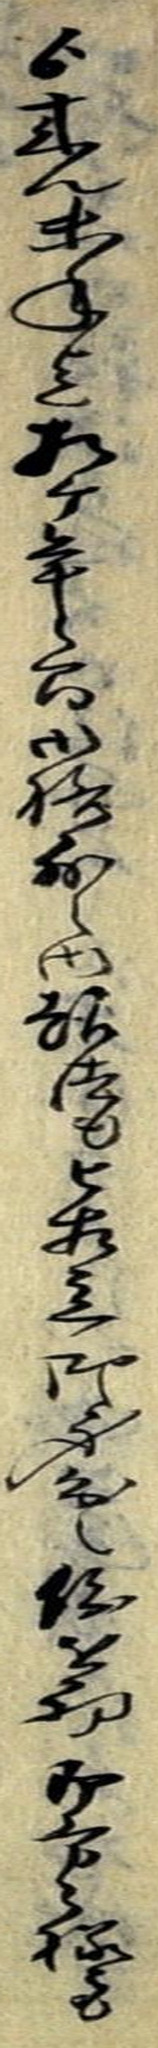ゟ来ル未年迄拾ケ年之間御格外之御趣法も被相立御身分之儀を初御方々様ニも
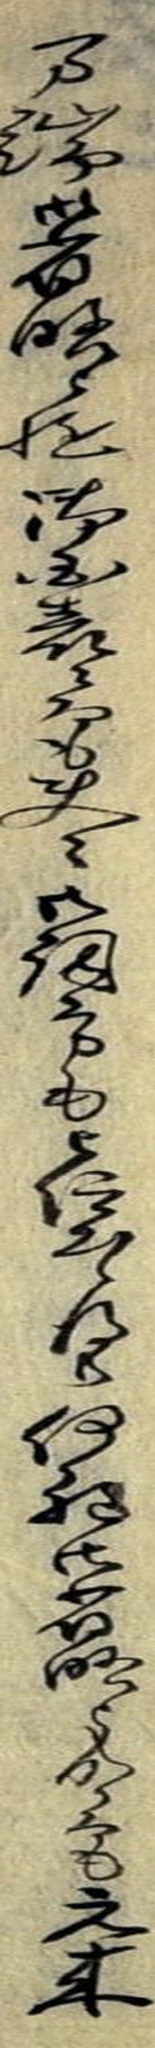万端御省略被遊御国表ニ而も夫々御調方も被仰出候得共何程御省略被成候而も元来
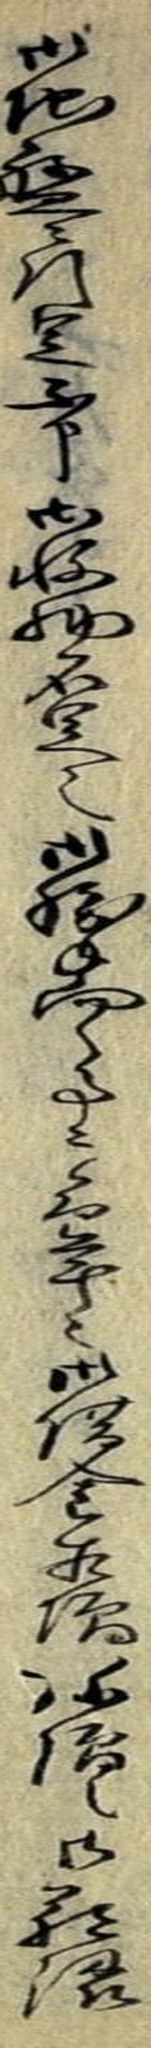御地盤ニ引足不申御収納不足之御勝手向之事ニ候而年々御借金相増弥増之御難渋
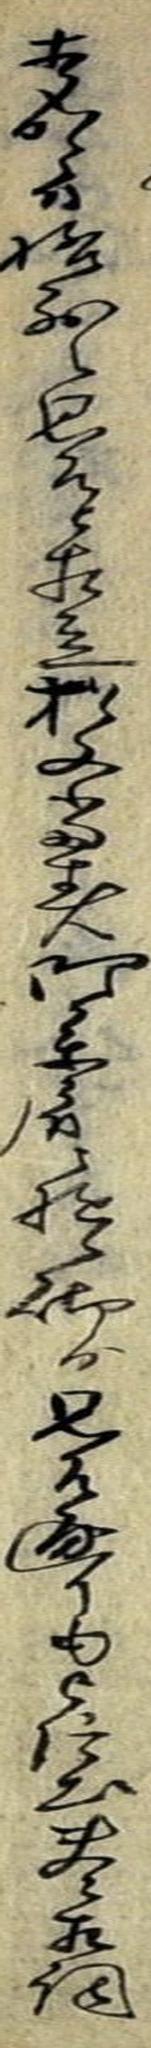相成候ニ付格外之思召被相立猶又当春御参府被遊候砌ゟ思召通りも被仰出夫々相調
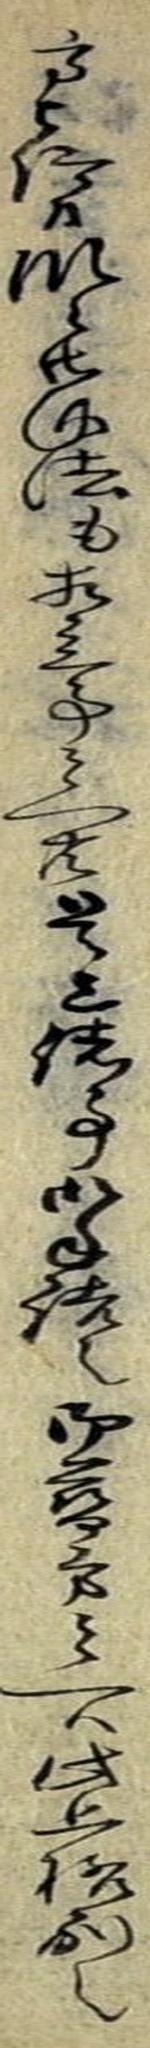方被仰付段々御趣法も相立事ニ候へ共是迄諸事御手詰之御暮方ニ候ヘハ此上格別之
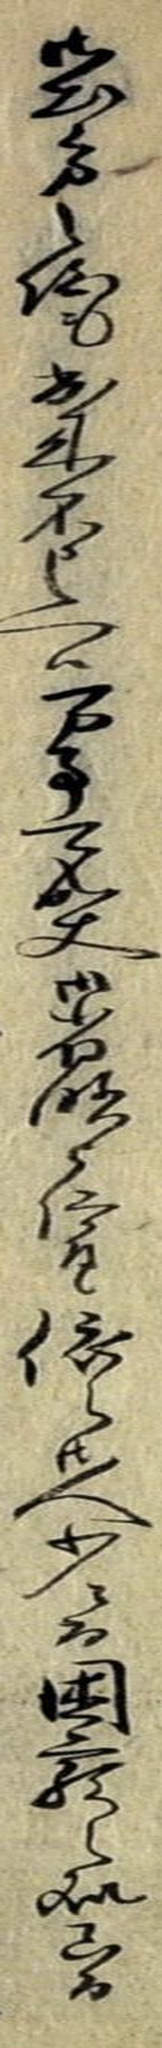御出方之儀も出来不申候ヘハ万事可成丈御省略被仰付候依之御人少ニ而困窮之処至而
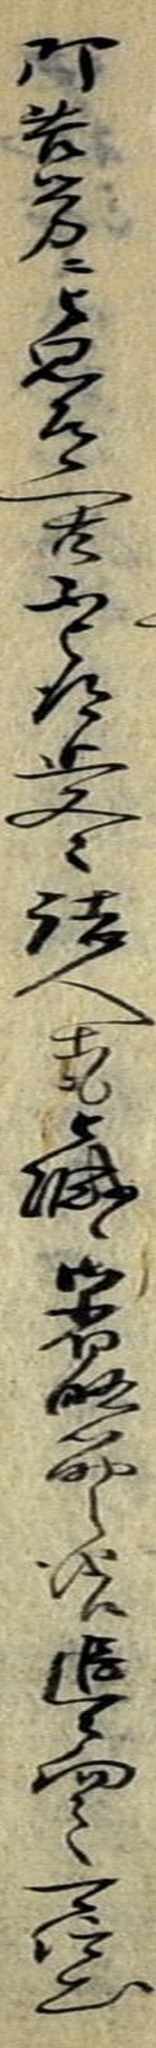御苦労ニ被思召候へ共不被得止又々詰人等も被減候御省略筋之儀ハ追々向々へ可仰出
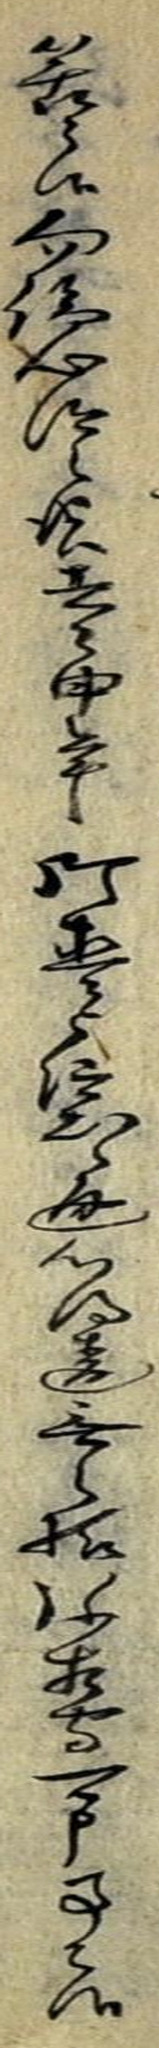筈ニ候勿論心得之儀ハ去々申年御直ニ被仰出候通心得違無之様弥相守可申事ニ候
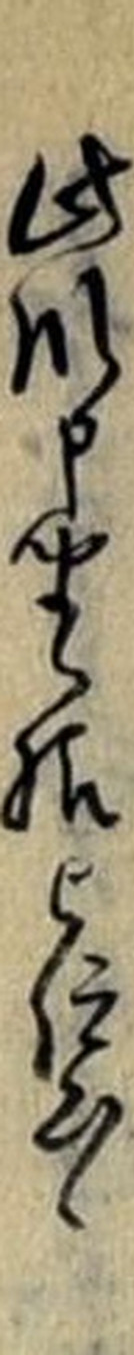此段申聞候様被仰出候
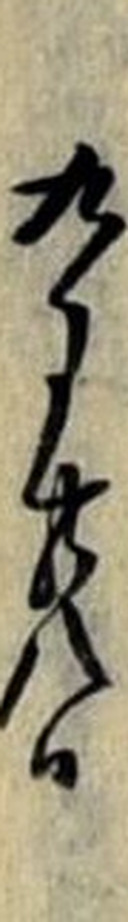九月廿八日
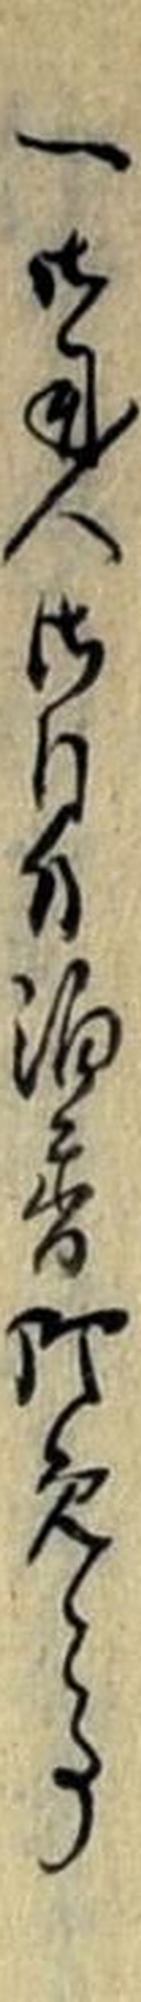一御用人御目付泊番御免之事
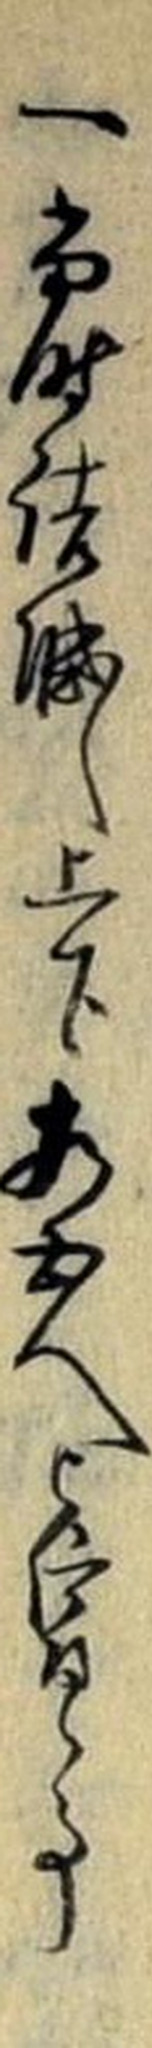一当時詰減し上下拾五人被仰付候事
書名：命令之部 三
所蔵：福井県文書館 Fukui Prefectural Archives
